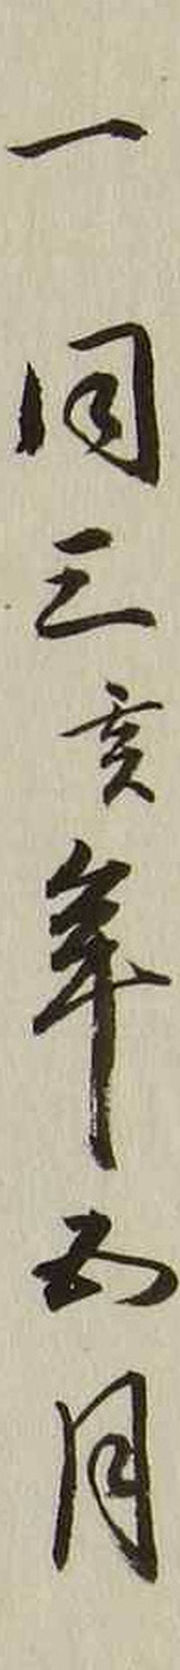一同三亥年五月
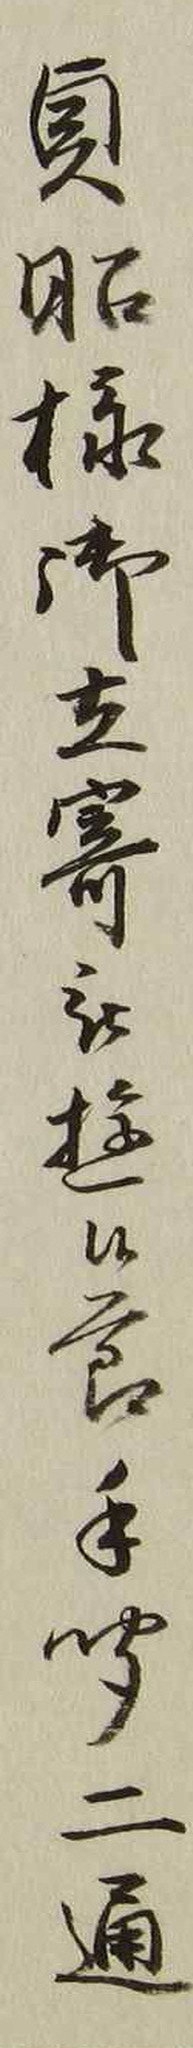貞昭様御立寄被遊候節手聞二通
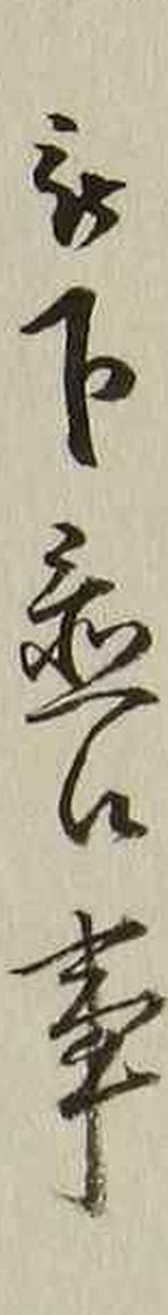被下置候事
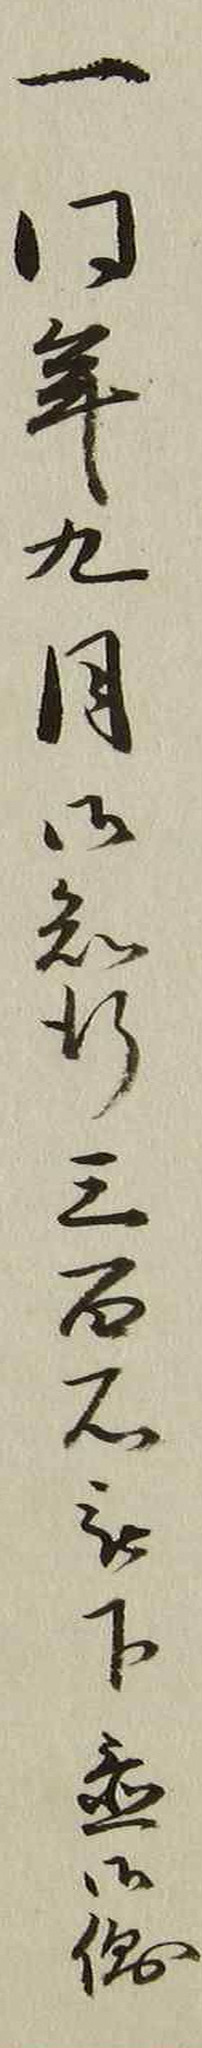一同年九月御知行三百石被下置御側
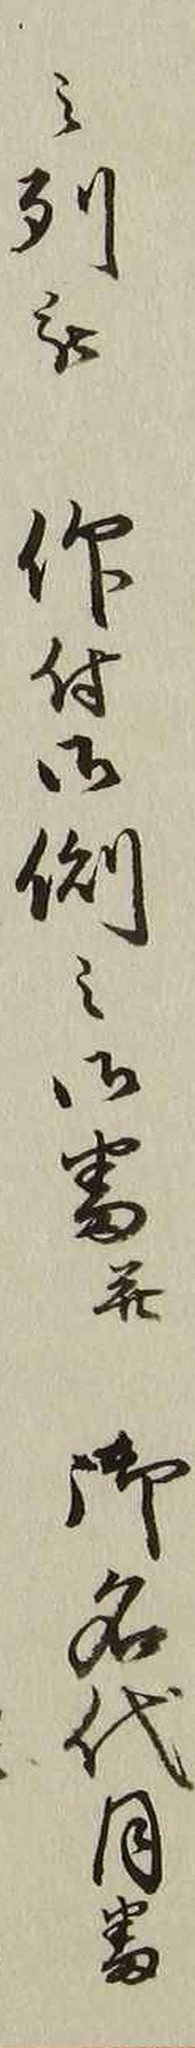之列被仰付御側之御番并御名代月番
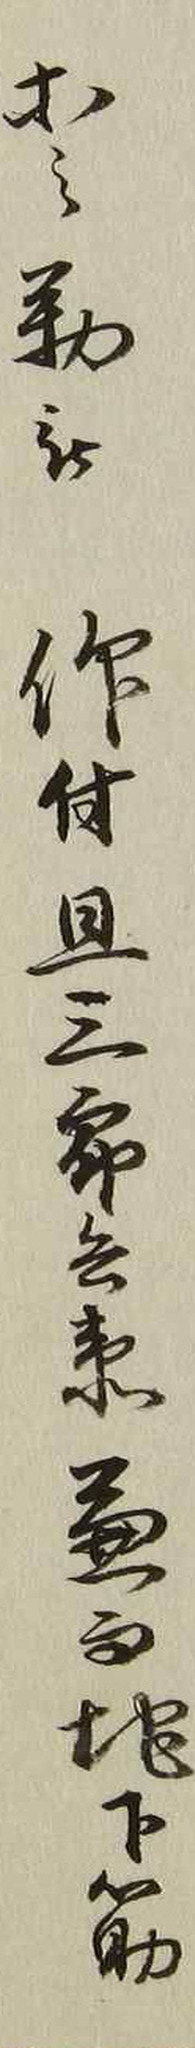等之勤被仰付且三郎兵衛兼而地下筋
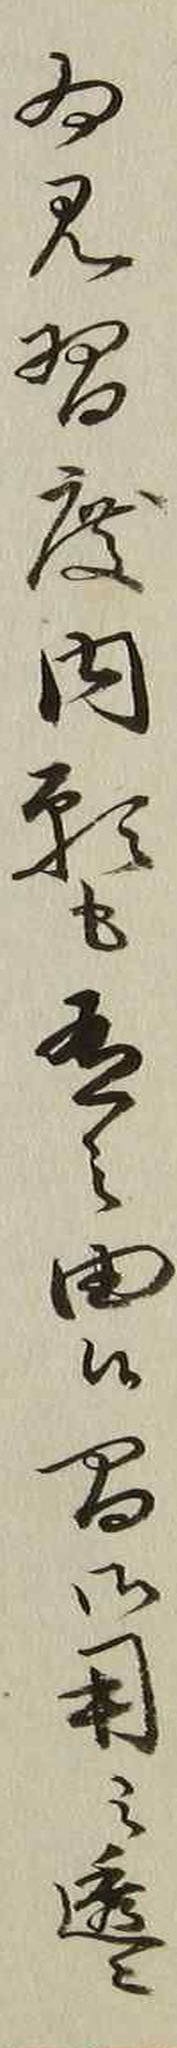為見習度内願も有之由候間音用之透に
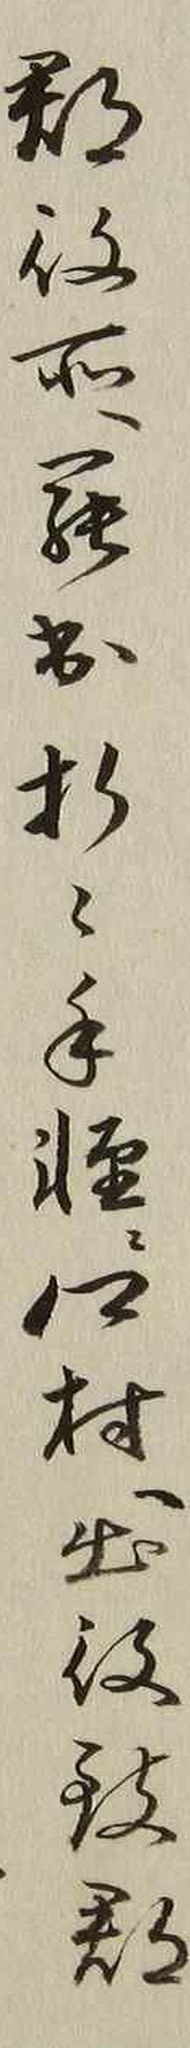郡役所へ罷出折々て手軽に郷村へ出役致郡
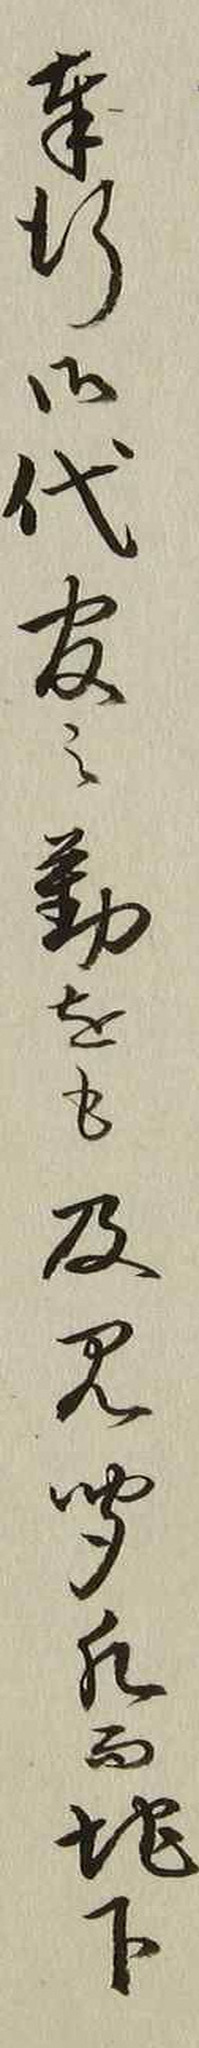奉行御代官之勤をも及見聞凡而地下
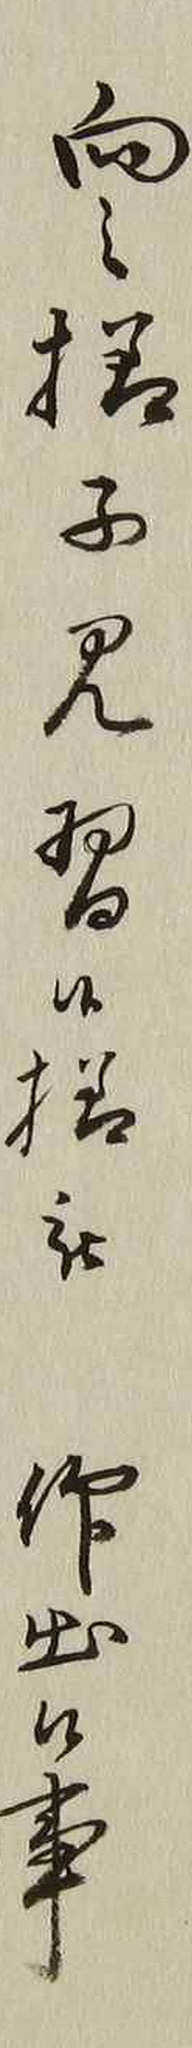向之様子見習候様被仰出候事
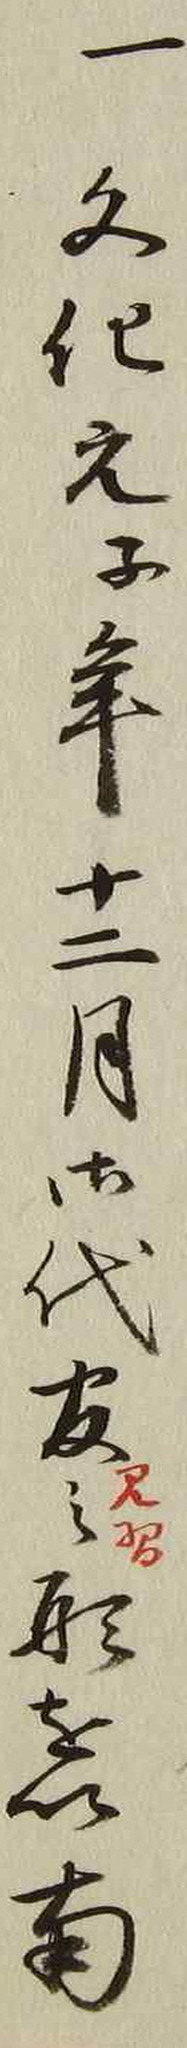一文化元子年十二月御代官見習之形を以南
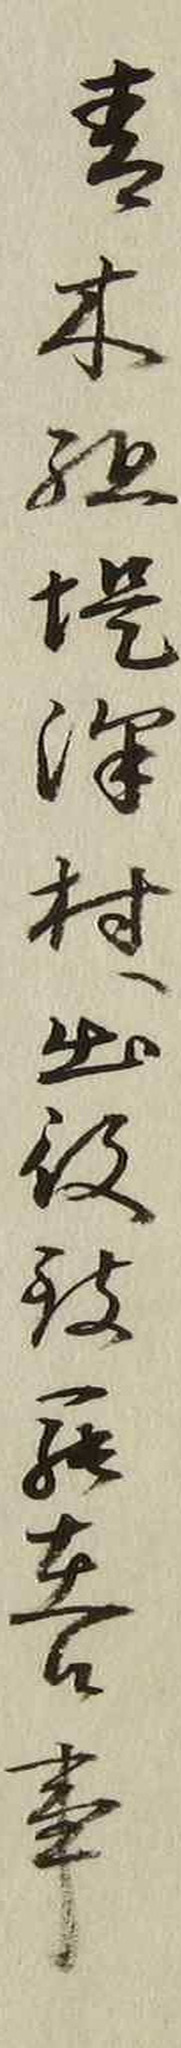青木組提沢村へ出役致罷在候事
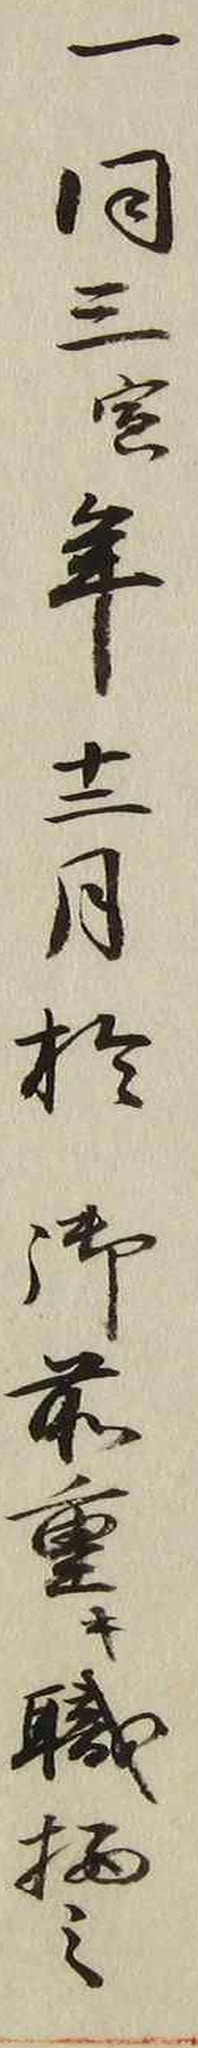一同三寅年十二月於御前重き職柄之
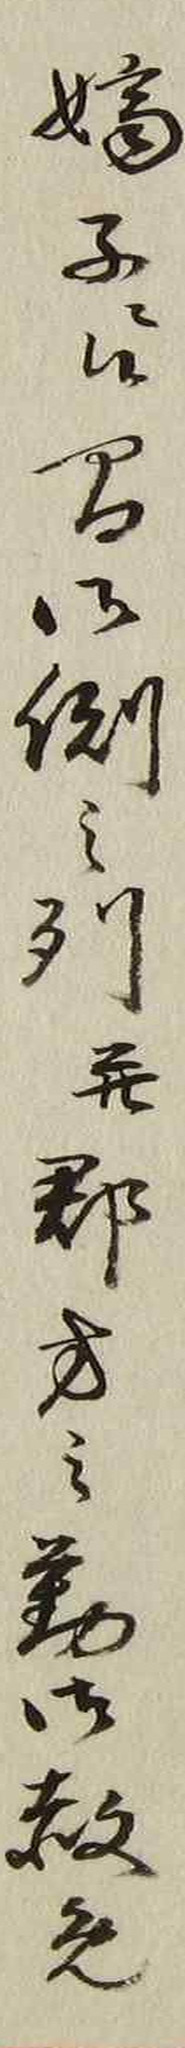嫡子に候間御側之列并郡方之勤御赦免
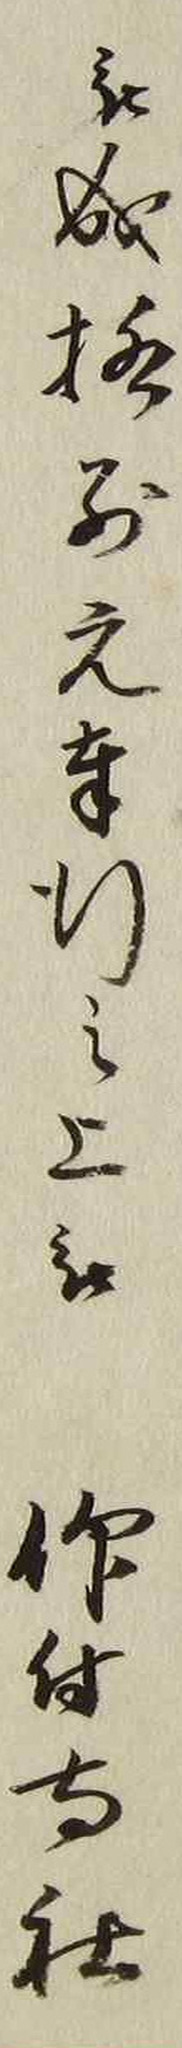被成格別元奉行之上被仰付寺社
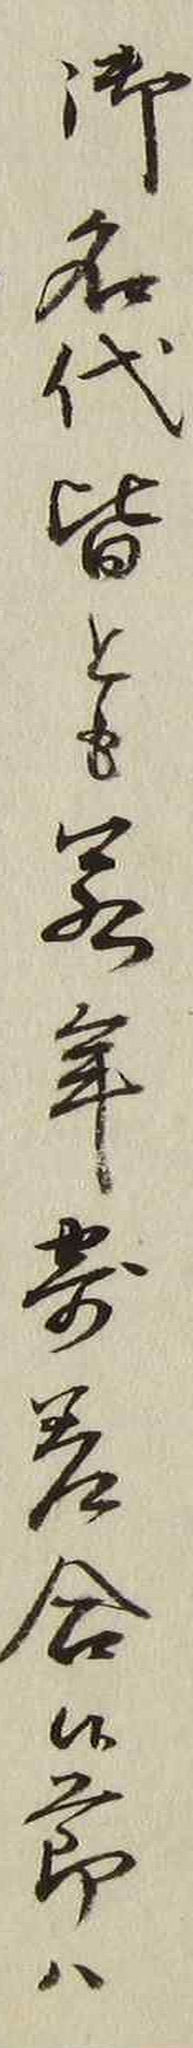御名代皆とも若年寄差合候節は
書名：諸士系譜　巻之125　た之部1
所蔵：会津若松市立会津図書館
